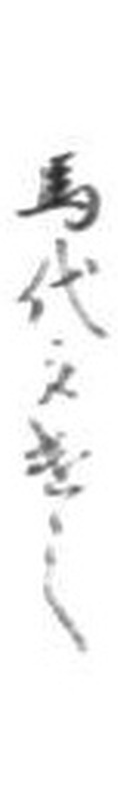馬代被遣之
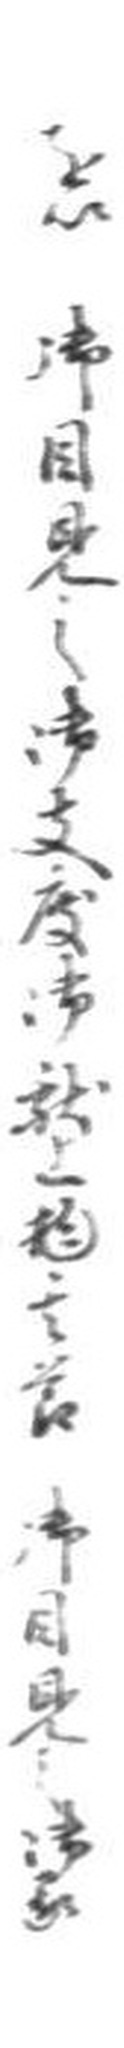を以御目見之御支度御献上物其節御目見之御家
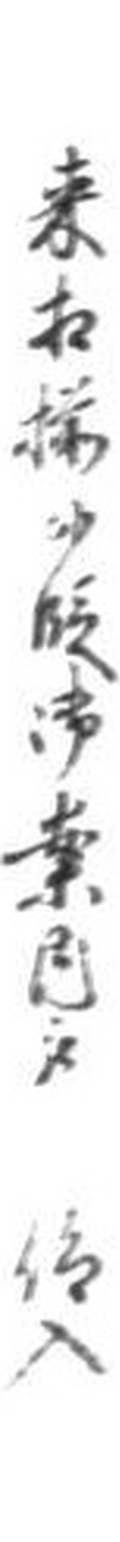来相揃候段御案内被仰入
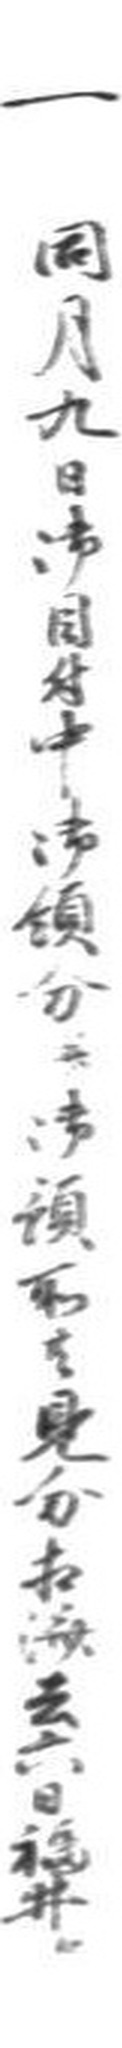一同月九日御目付中御領分幷御預所共見分相済去六日福井江

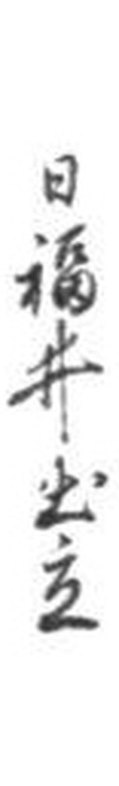日福井出立
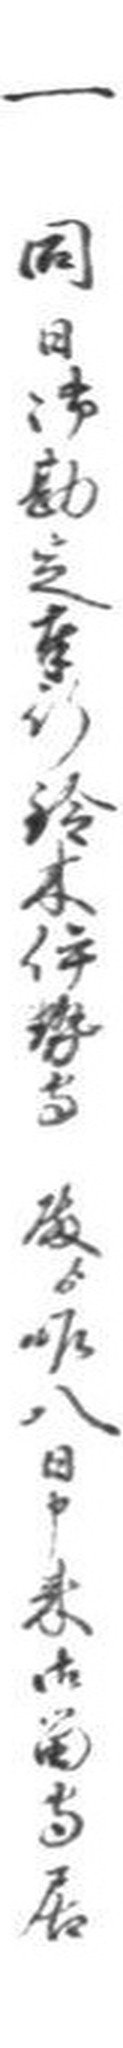一同日御勘定奉行鈴木伊勢守殿ゟ昨八日申来御留守居
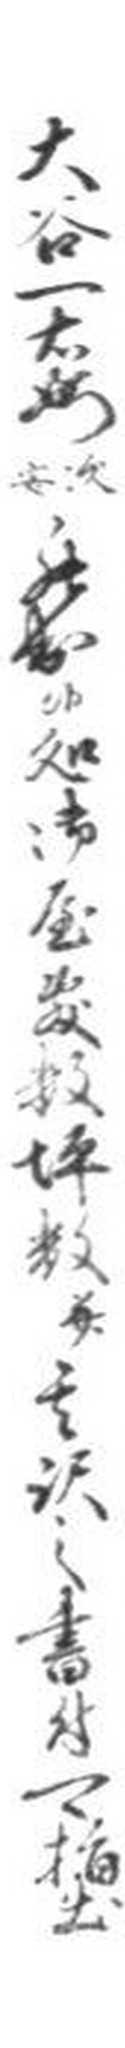大谷一右衛門次安罷出候処御屋敷数坪数幷其訳之書付可指出
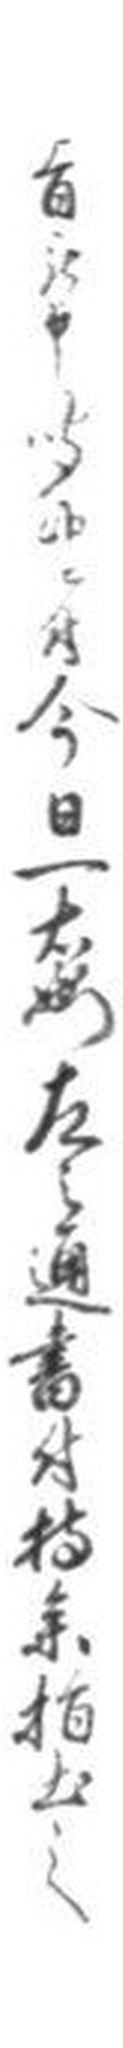旨被申聞候ニ付今日一右衛門左之通書付持参指出之
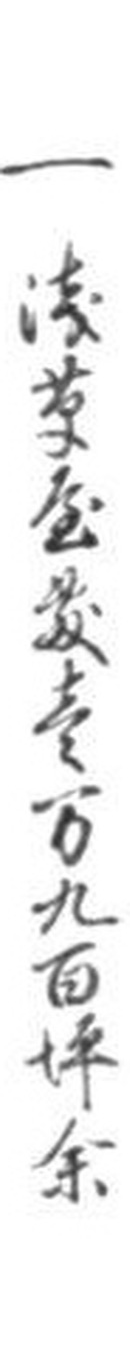一浅草屋敷壱万九百坪余
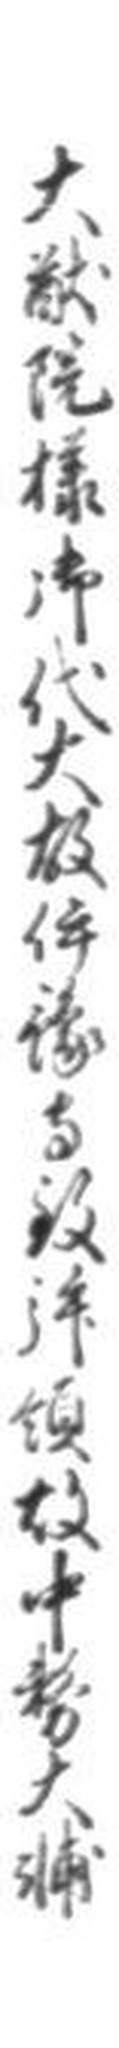大猷院様御代大故伊予守致拝領故中務大輔
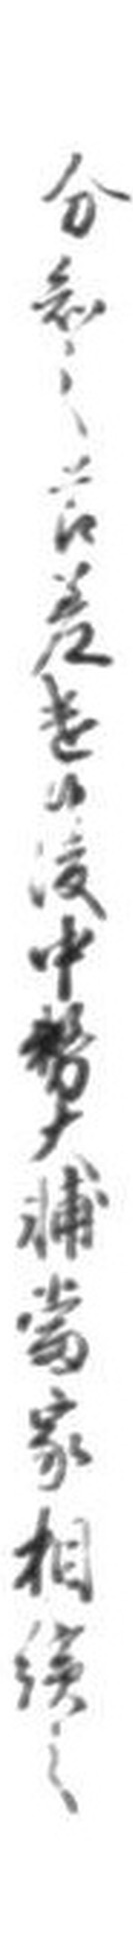分知之節差遣候後中務大輔当家相談之
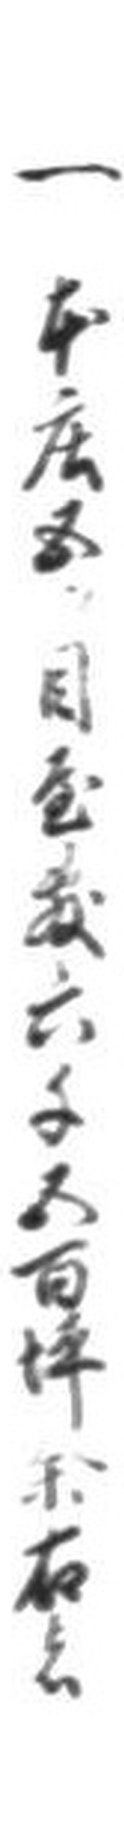一本庄五ツ目屋敷六千五百坪余右者
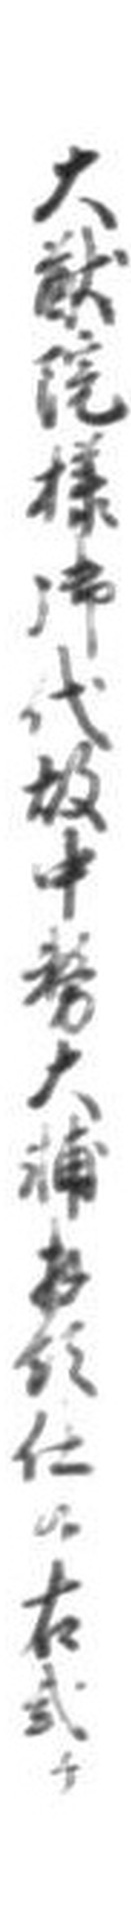大猷院様御代故中務大輔拝領仕候右弐ケ
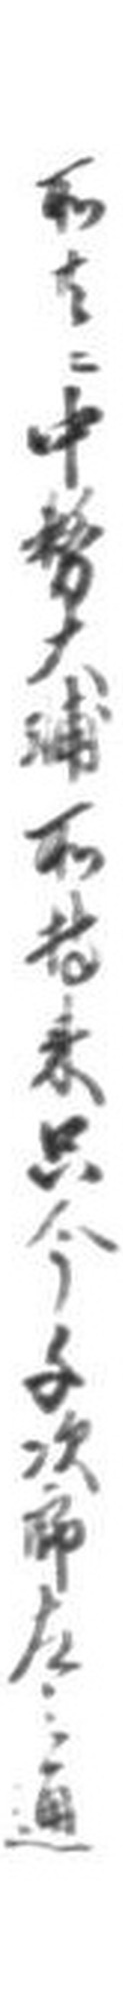所共ニ中務大輔所持来只今千次郎左之通
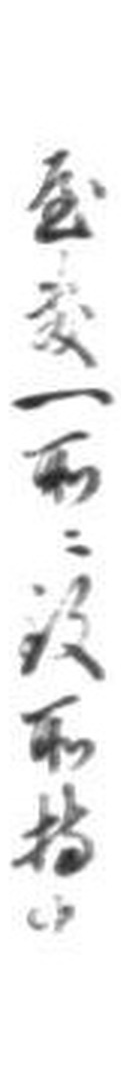屋敷一所ニ致所持候
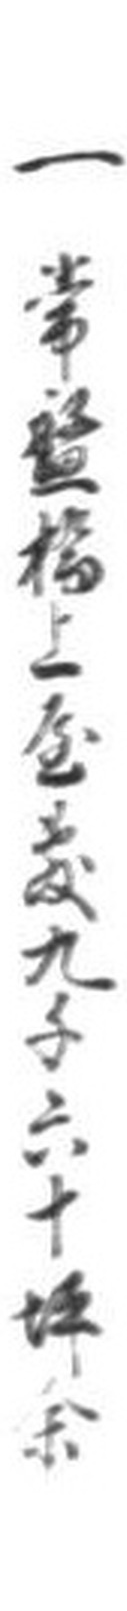一常盤橋上屋敷九千六十坪余
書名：家譜 三十九 宗矩公 享保十年
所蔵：福井県文書館 Fukui Prefectural Archives
